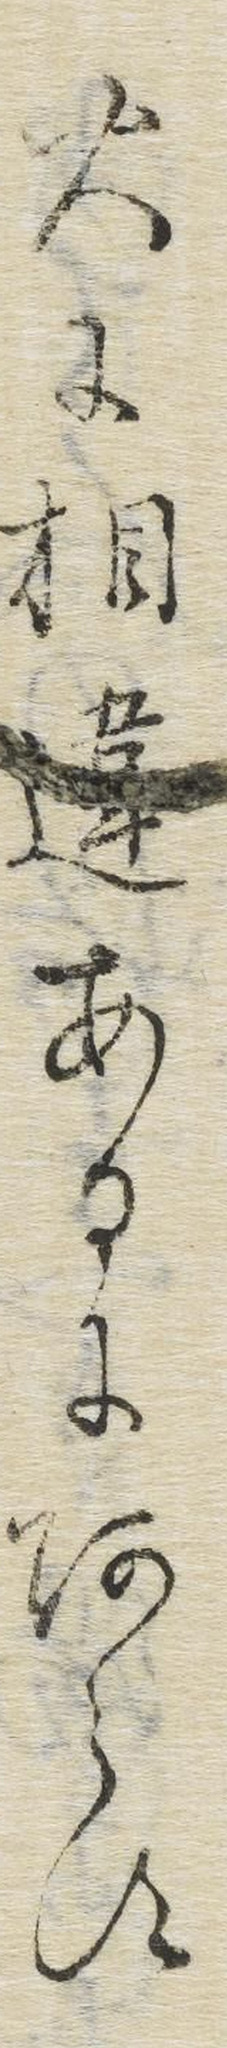火に相違あるにあらす
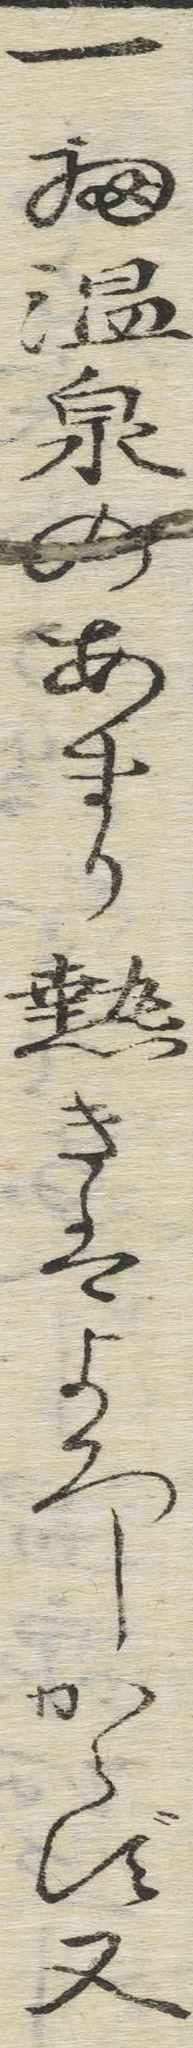一扨温泉のあまり熱きはよろしからす又
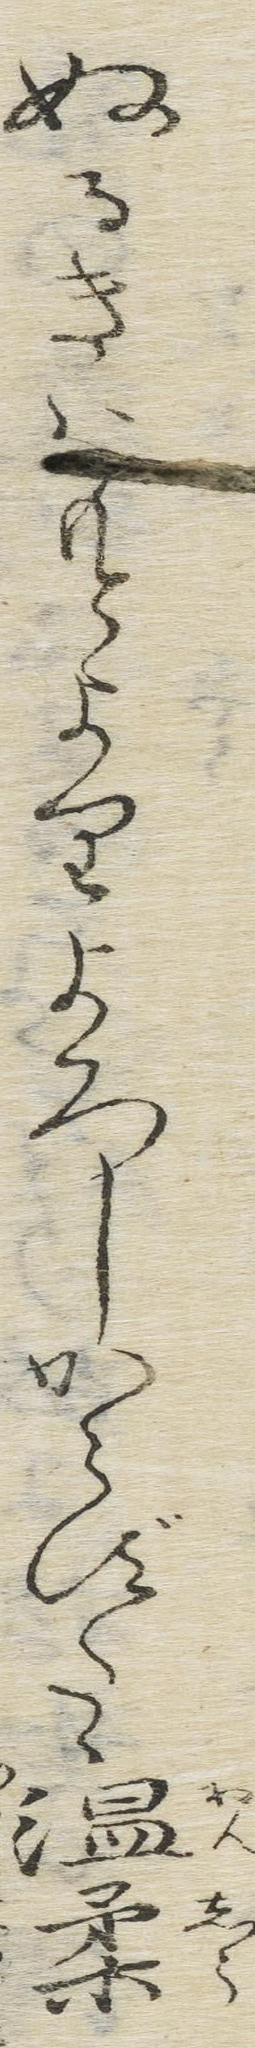ぬるきはもとよりよろしからずたゝ温柔
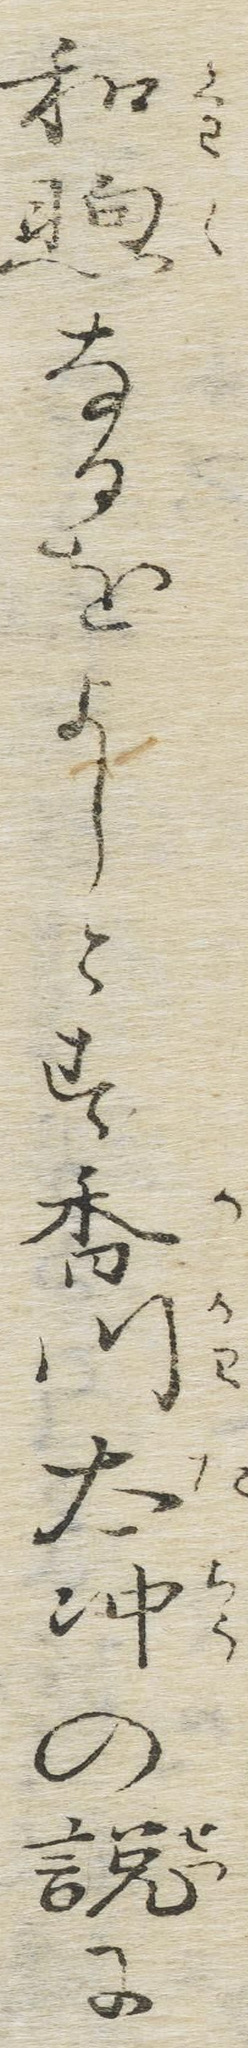和煦なるをよしとす香川太冲の説に
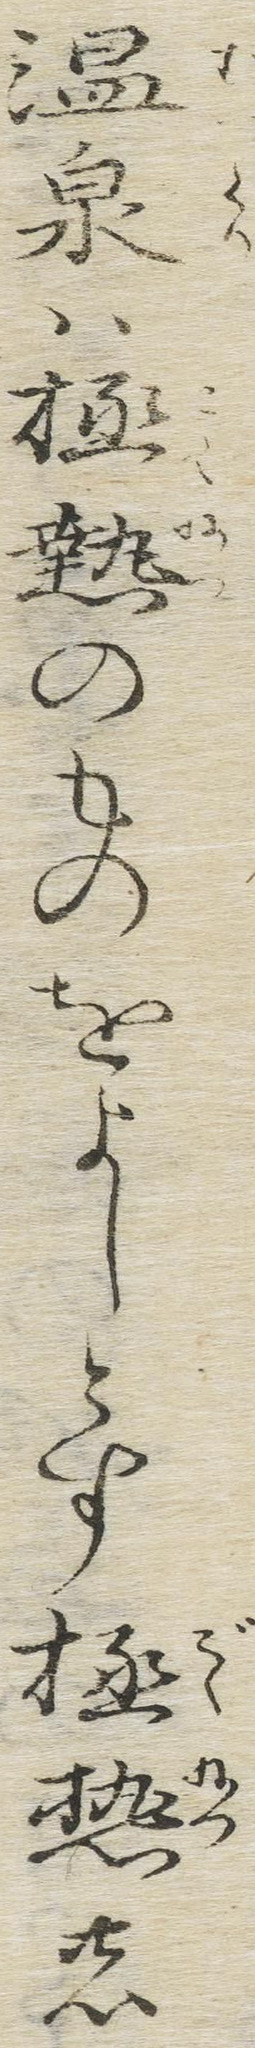温泉は極熱のものをよしとす極熱の
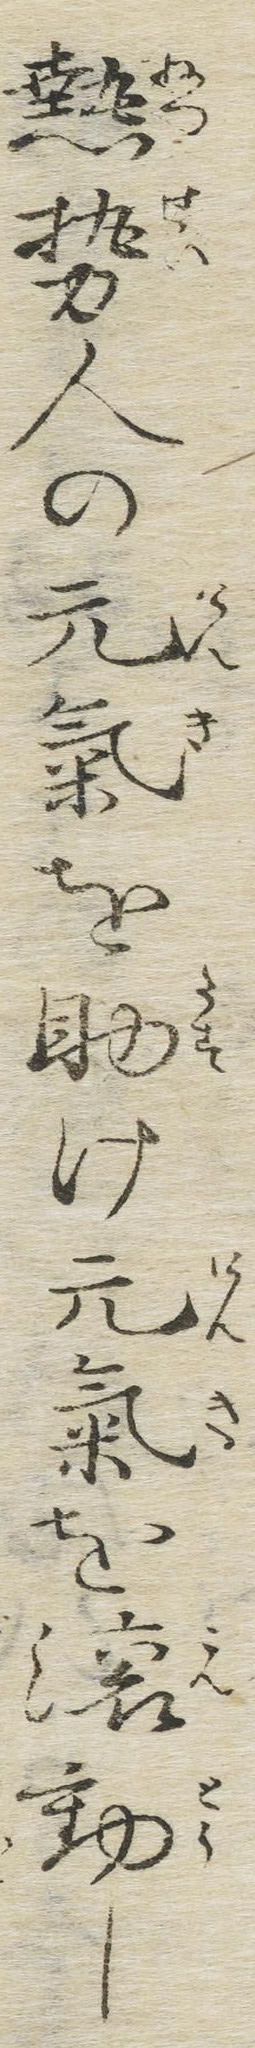熱勢人の元気を助け元気を滾動し
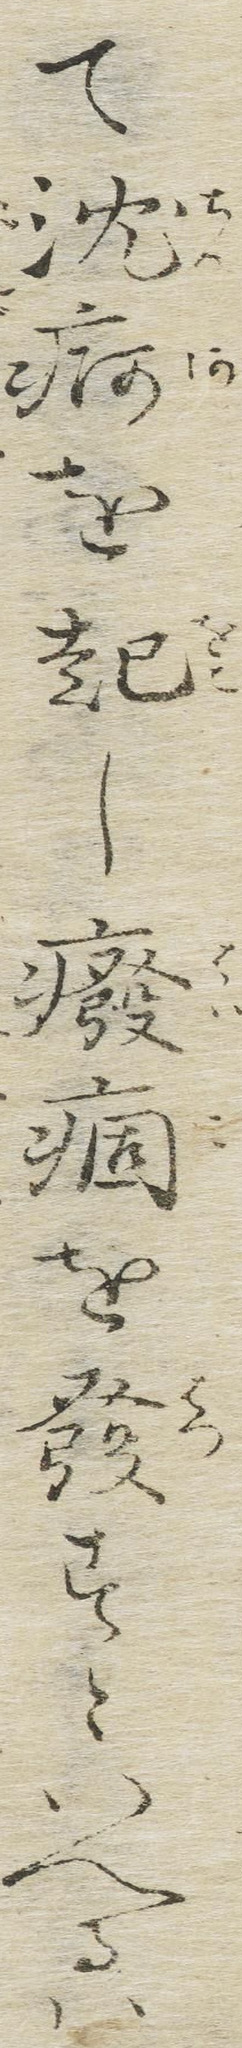て沈痾を起し癈痼を発すといへるは
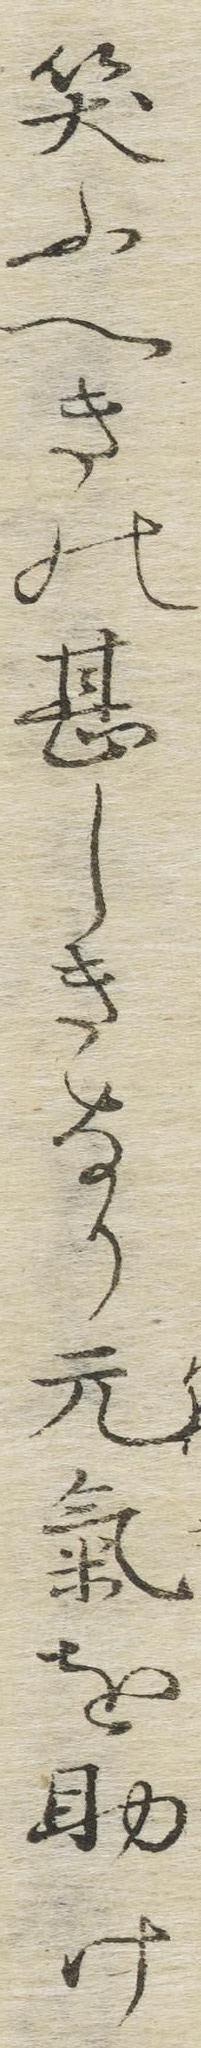笑ふへきの甚しきなり元気を助け
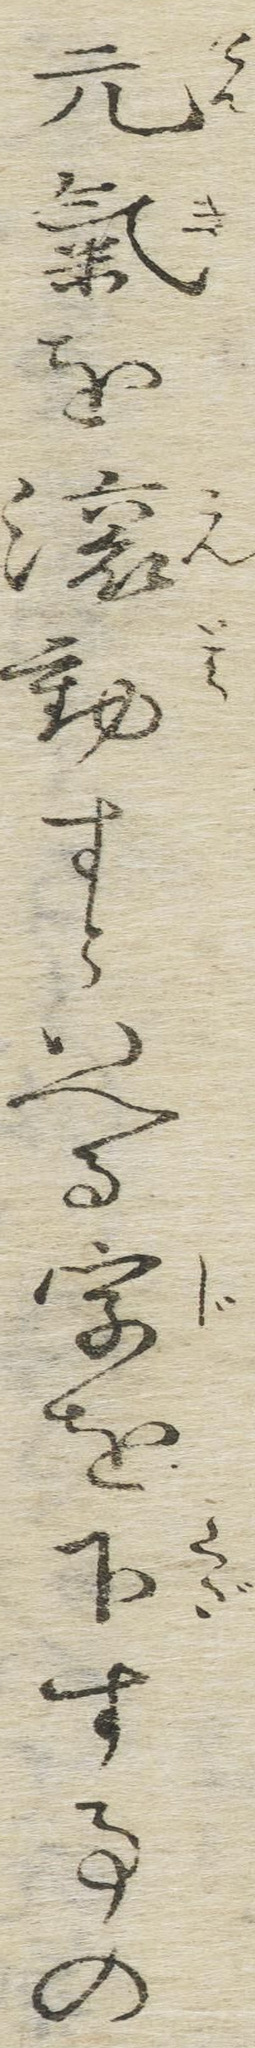元気を滾動すといへる字を下す事の

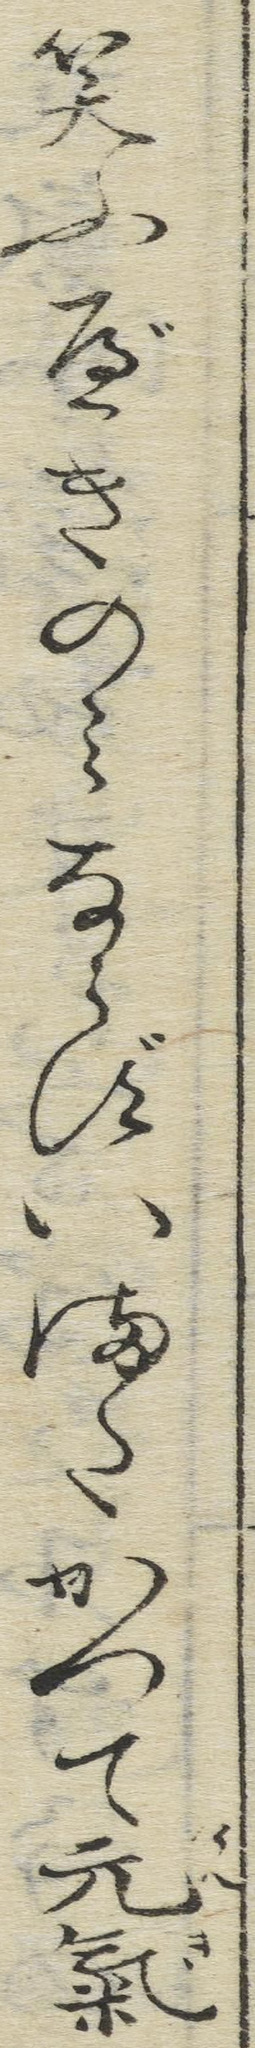笑ふべきのみならずいまたかつて元気
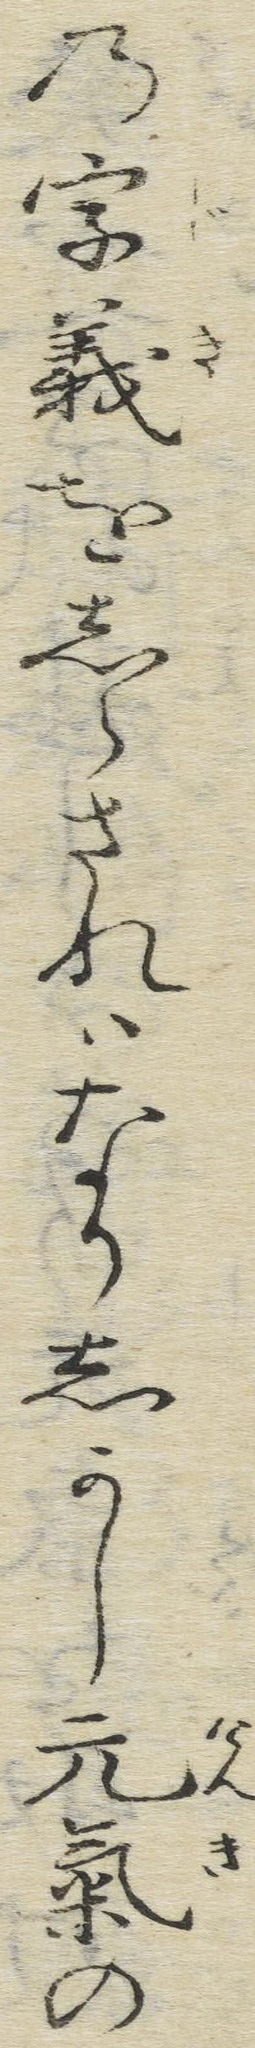の字義をしらされはなりしかし元気の
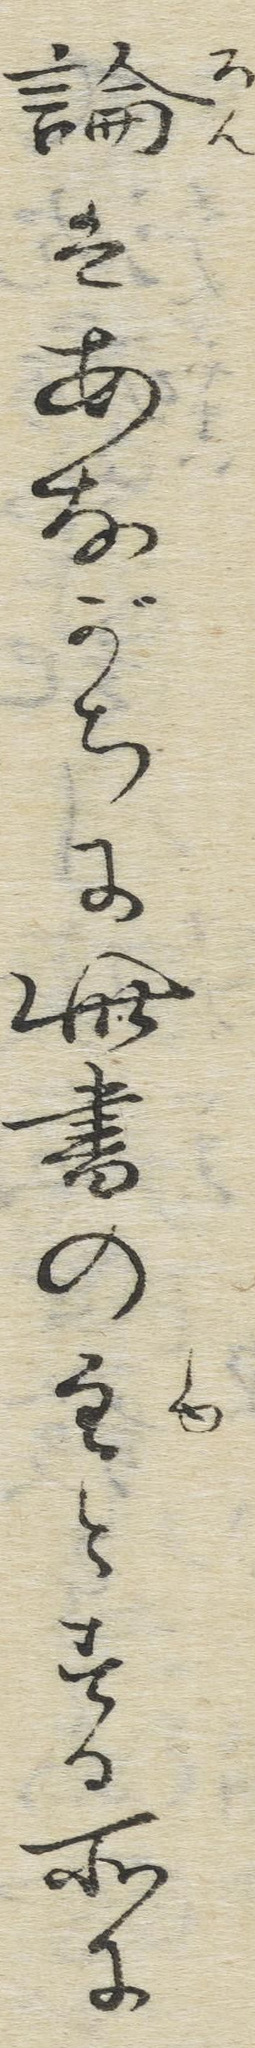論はあながちに此書の主とする所に
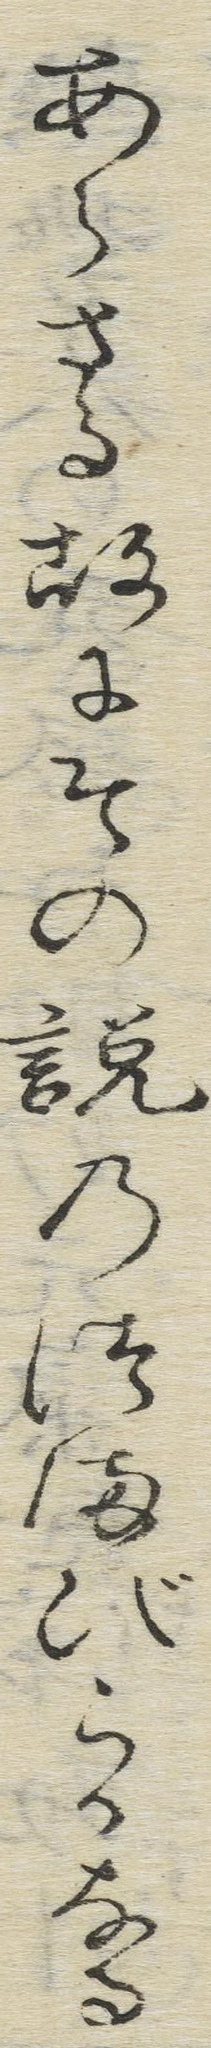あらさる故にその説のつまびらかなる
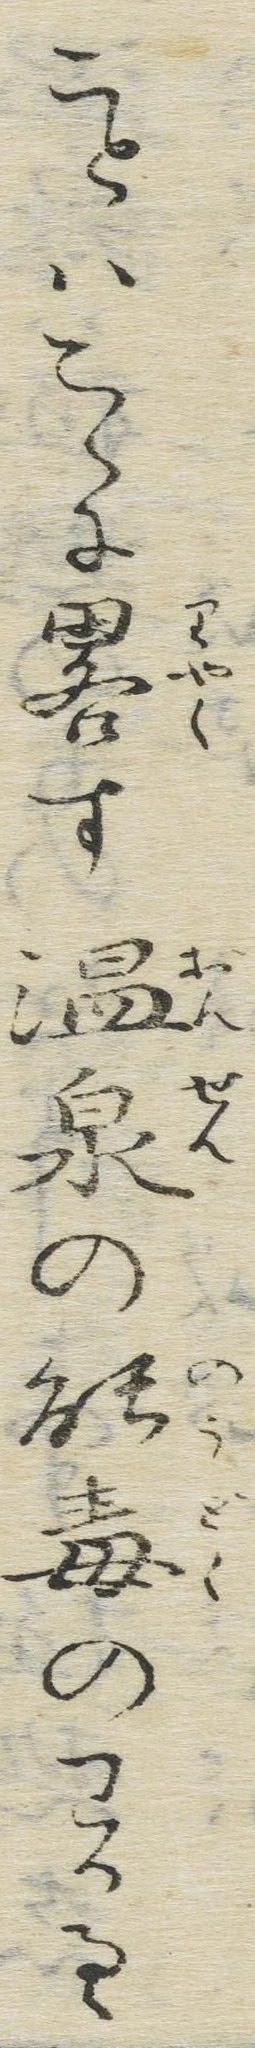ことはこゝに略す温泉の能毒のわかるゝ
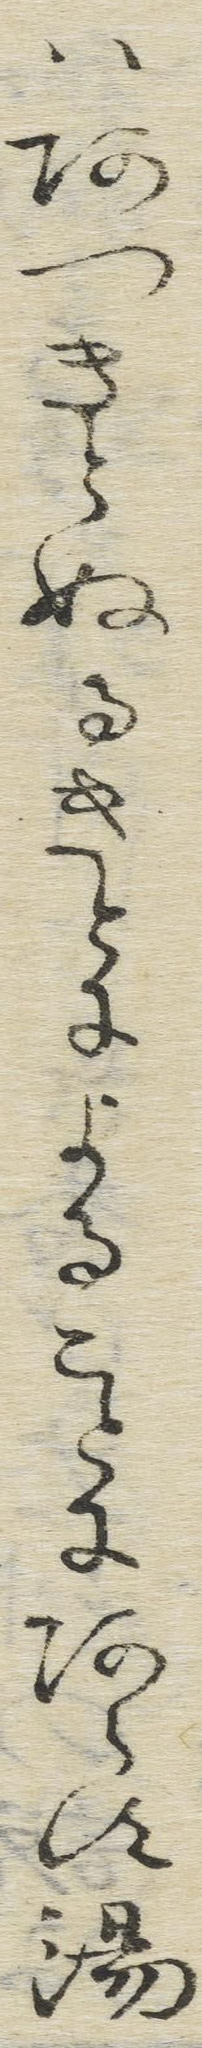はあつきとぬるきとによることにあらす湯
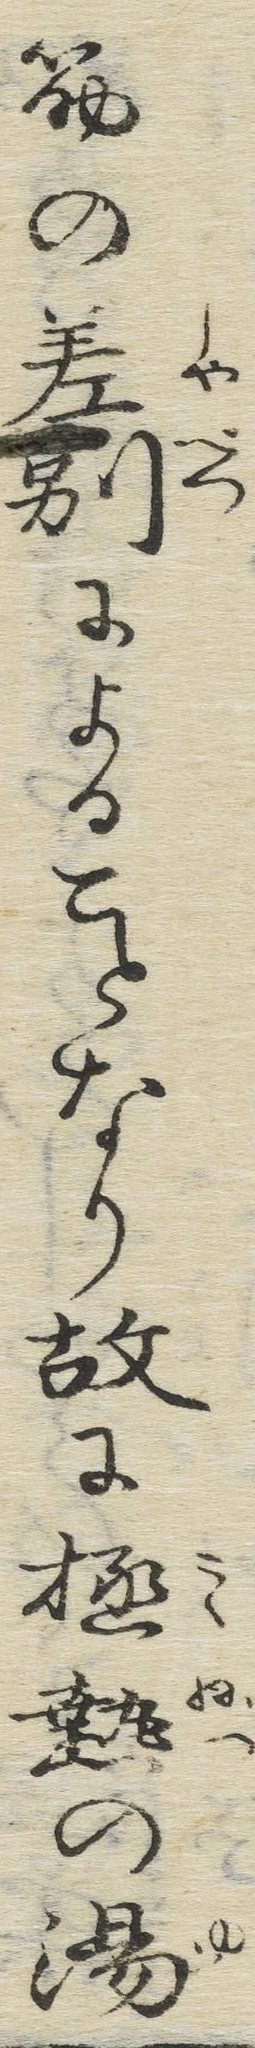筋の差別によることなり故に極熱の湯
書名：温泉考
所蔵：東京大学地震研究所図書室 Earthquake Research Institute Library, The University of Tokyo, JAPAN
